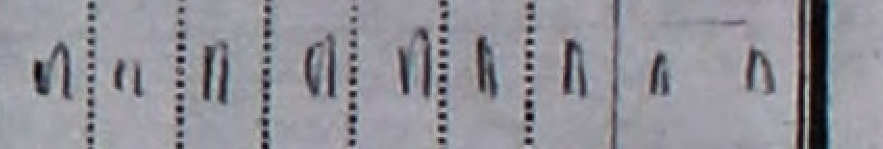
„ „ „ „ „ „ „ „ „
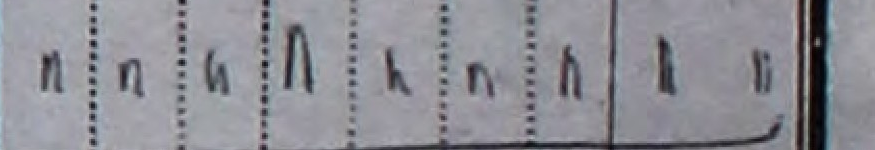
„ „ „ „ „ „ „ „ „
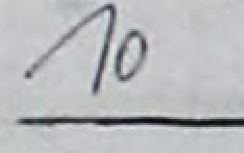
10
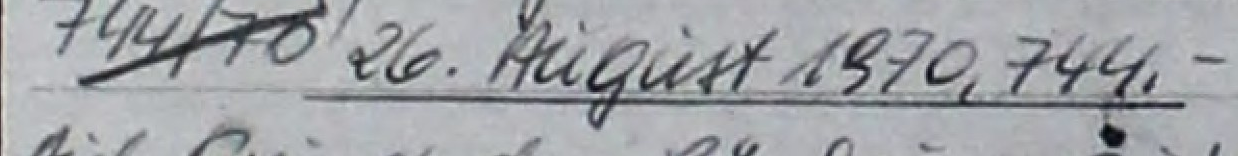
744/70 26. August 1970, 744.-
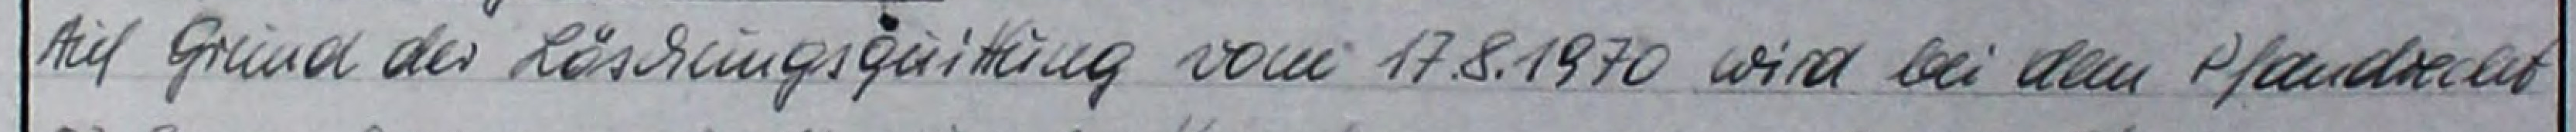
Auf Grund des Löschungsquittung vom 17.8.1970 wird bei dem Pfandrecht
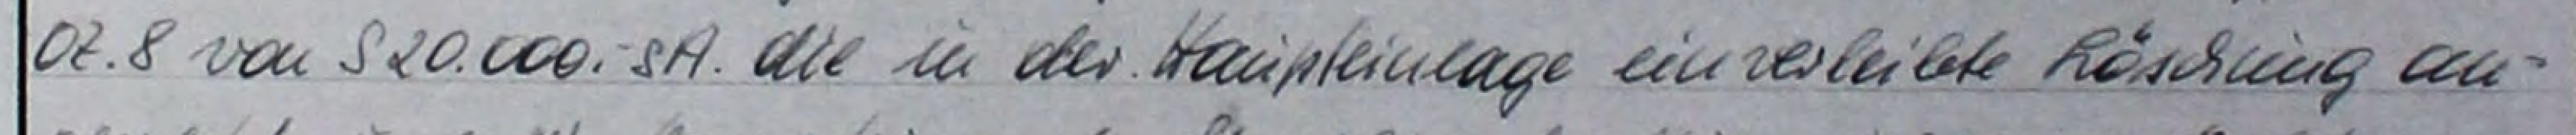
07.8 von S 20.000 i s A. die in der Haupteinlage einverleibte Löschung an„
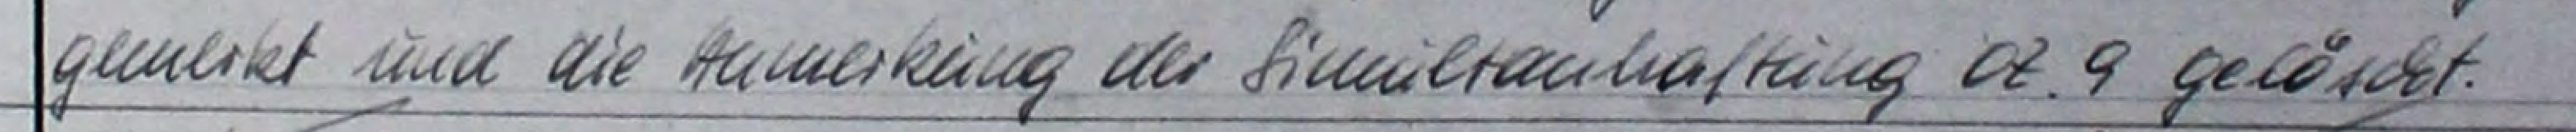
gemerkt und die Anmerkung der Simultanhaftung 07.9 gelöscht.
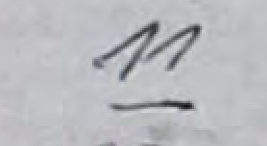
11
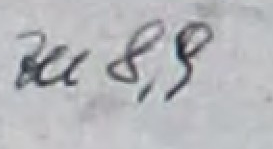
zu 8, 9
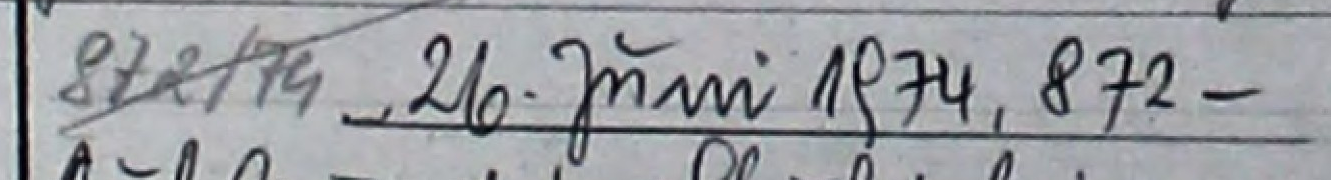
872/74 26. Juni 1974, 872-
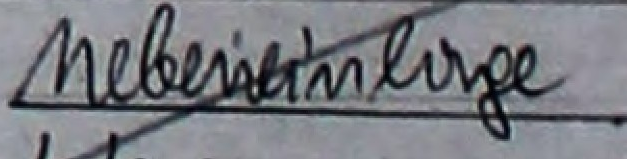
Nebeneinlage
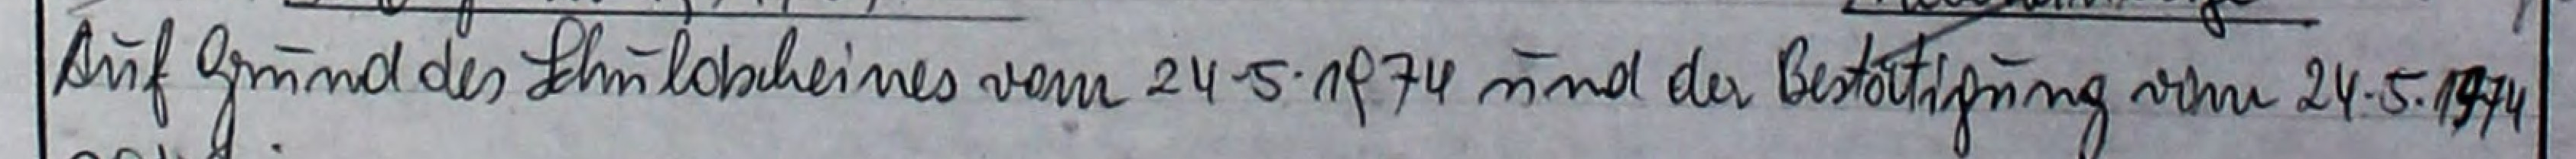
Auf Grund des Schuldscheines vom 24.5.1974 und der Bestätigung vom 24.5.1974
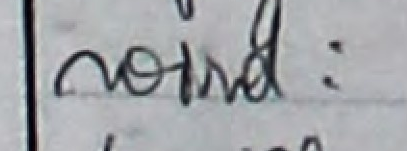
wird:
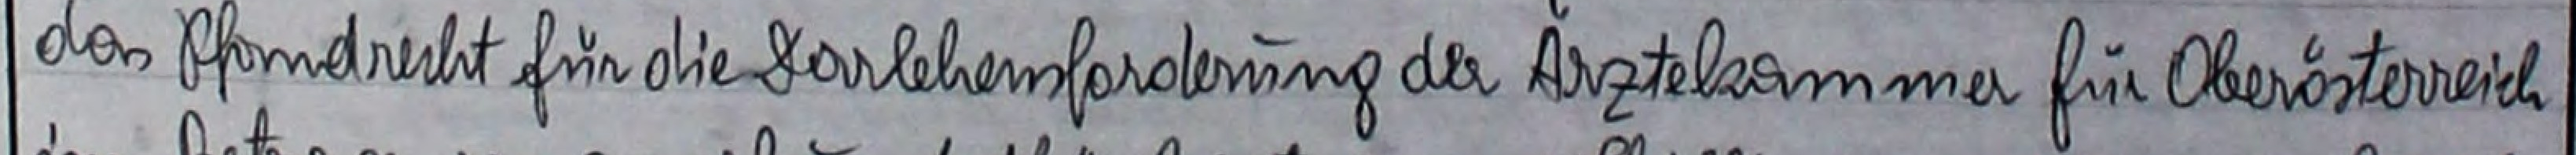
das Pfandrecht für die Darlehensforderung der Ärztekammer für Oberösterreich
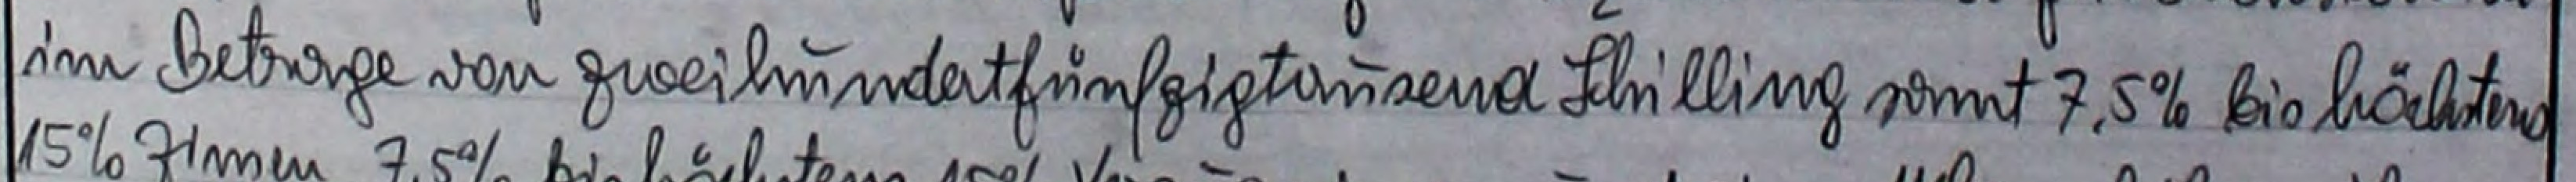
im Betrage von zweihundertfünfzigtausend Schilling samt 7.5% bis höchstens
